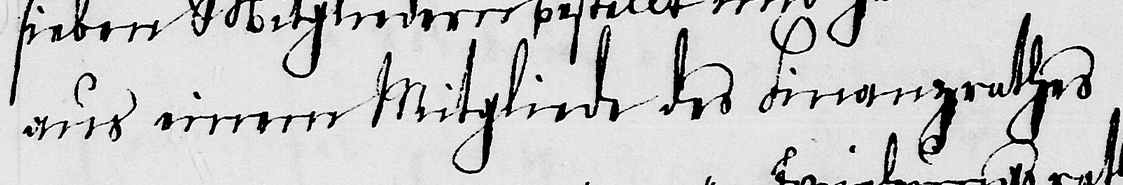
aus einem Mitgliede des Finanzrathes
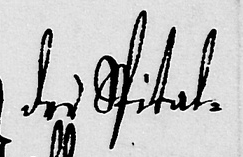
r Spital-
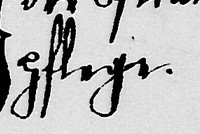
pflege.
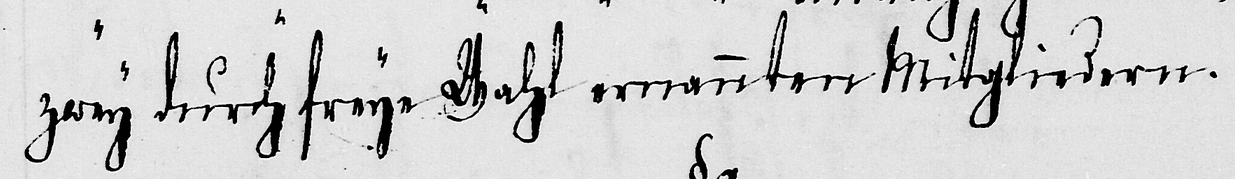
zwey durch freye Wahl ernannten Mitgliedern.
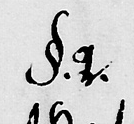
§.2.
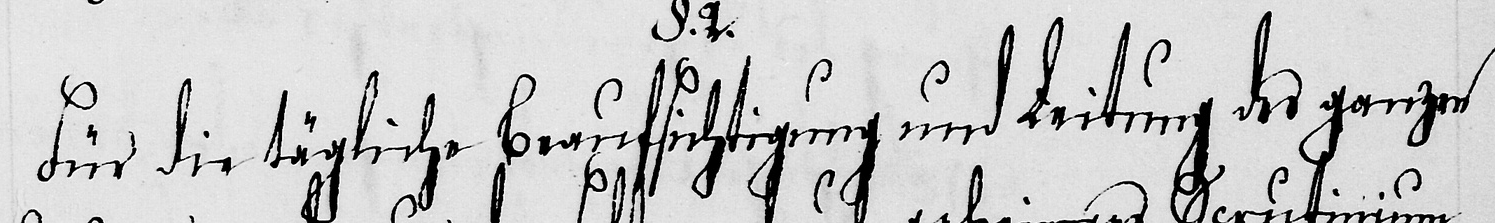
Für die tägliche Beaufsichtigung und Leitung
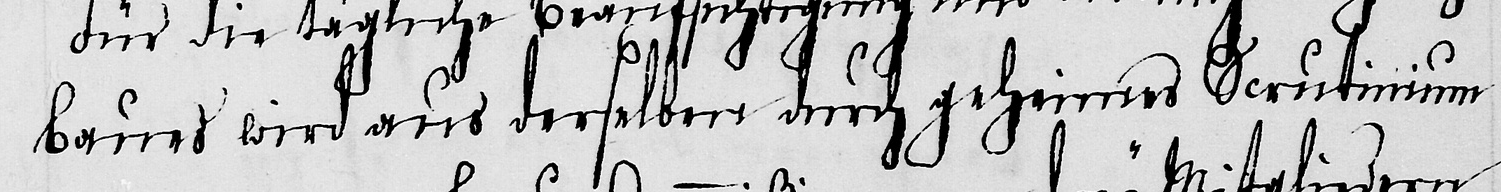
Baues wird aus derselben durch geheimes Scrutinium
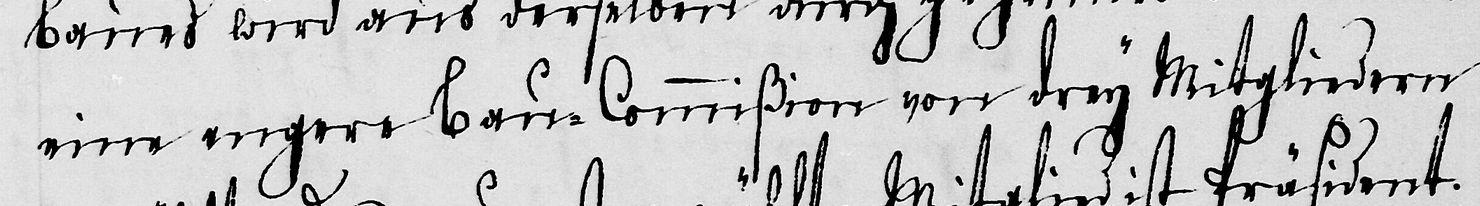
eine engere Bau-Commißion von drey Mitgliedern
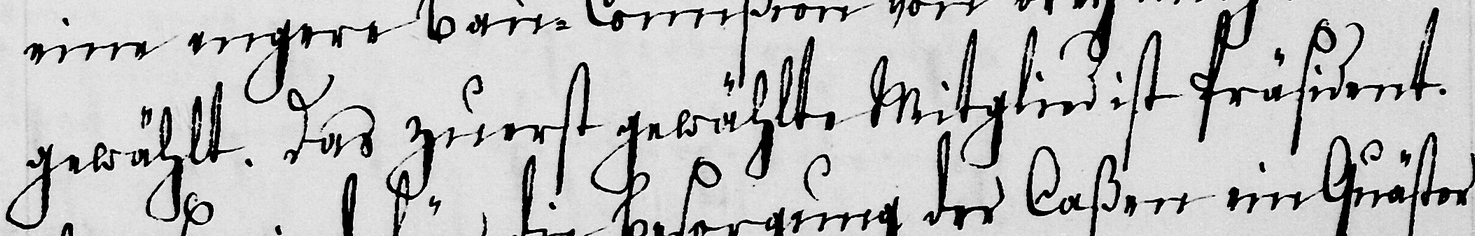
gewählt. Das zuerst gewählte Mitglied ist Präsident.
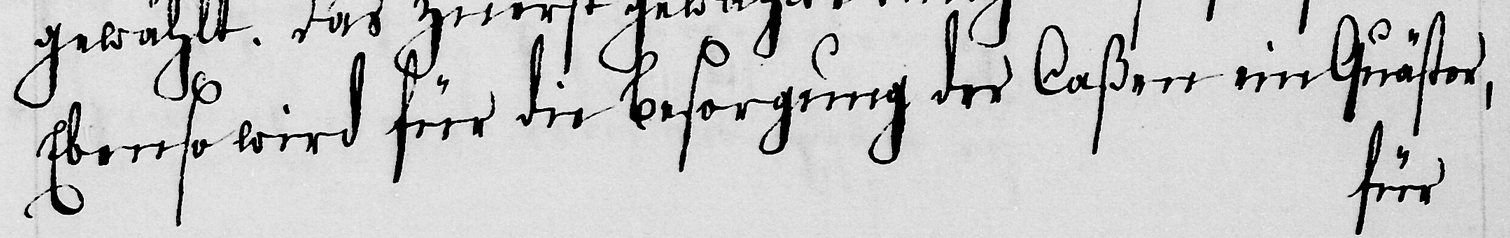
Ebenso wird für die Besorgung der Caßen ein Quästor,
